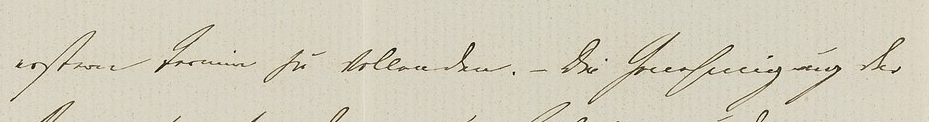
erstern Termin zu vollenden. – Die Genehmigung der
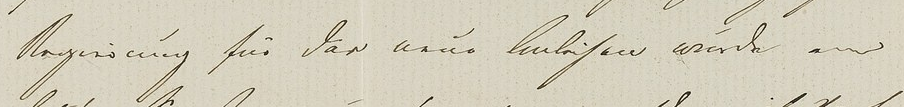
Regierung für das neue Anleihen wurde am
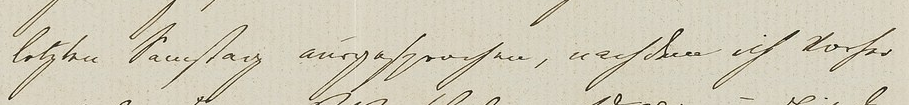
letzten Samstag ausgesprochen, nachdem ich vorher
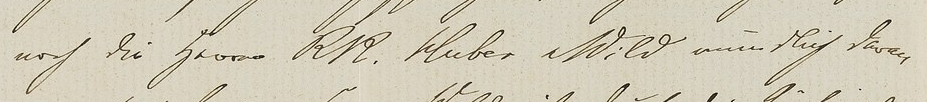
noch die Herren RR. Huber & Wild mündlich daran
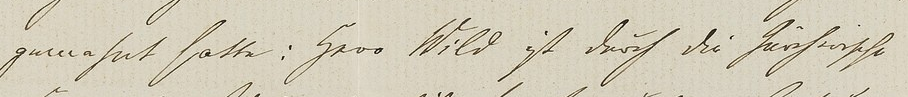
gemahnt hatte: Herr Wild ist durch die Zürcherische
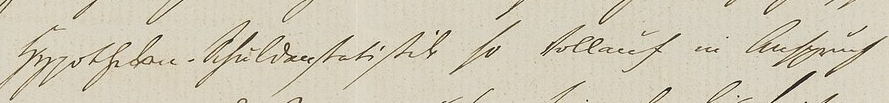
Hypotheken-Schuldenstatistik so vollauf in Anspruch
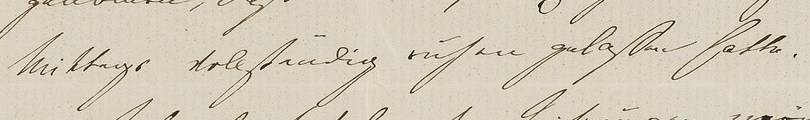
Mittags vollständig ruhen gelassen hatte.
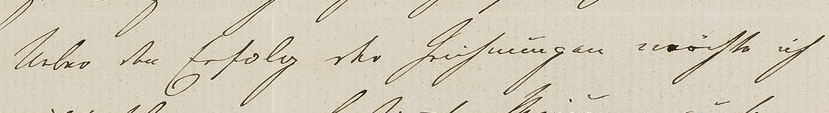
Ueber den Erfolg der Zeichnungen möchte ich
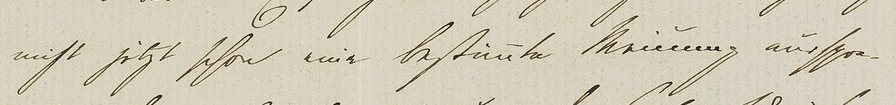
nicht jetzt schon eine bestimmte Meinung ausspre-
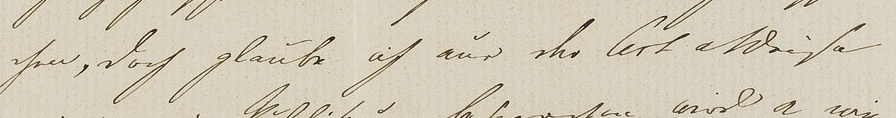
chen, doch glaube ich aus der Art & Weise,
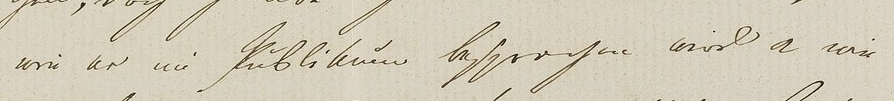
wie er im Publikum besprochen wird & wie
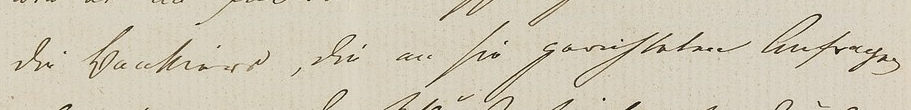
die Bankiers, die an sie gerichteten Anfragen
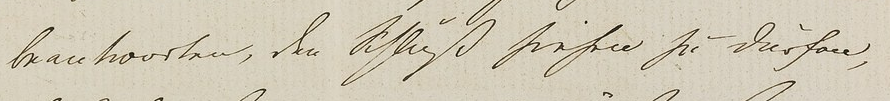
beantworten, den Schluß ziehen zu dürfen,
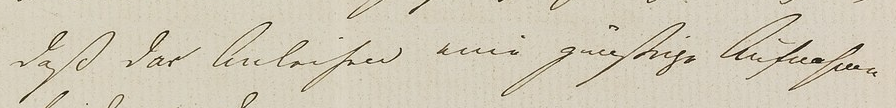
daß das Anleihen eine günstige Aufnahme
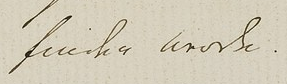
finden werde.
